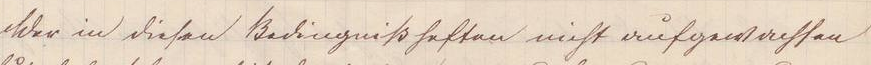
Wer in diesen Bedingnißheften nicht aufgewachsen
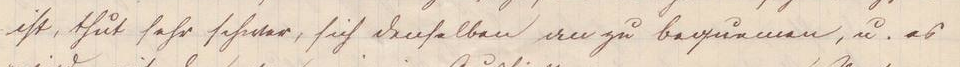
ist, thut sehr schwer, sich denselben an zu bequemen, u. es
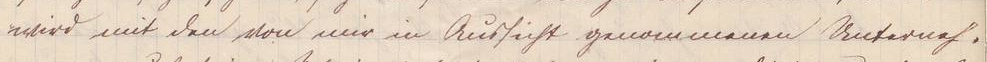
wird mit den von mir in Aussicht genommenen Unterneh-
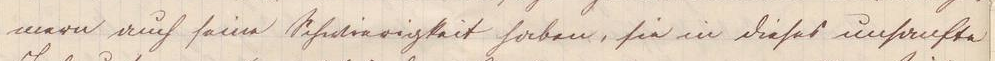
mern auch seine Schwierigkeit haben, sie in dieses unsanfte
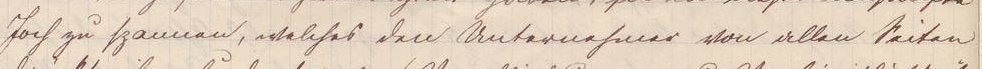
Joch zu spannen, welches den Unternehmer von allen Seiten
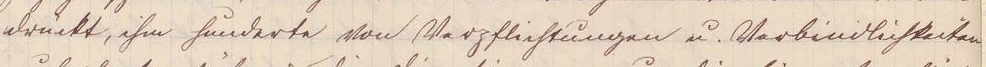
drückt, ihm hunderte von Verpflichtungen u. Verbindlichkeiten
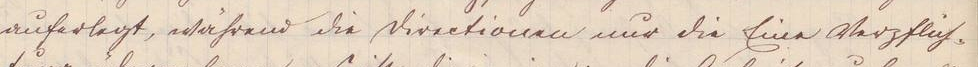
auferlegt, während die Directionen nur die Eine Verpflich-
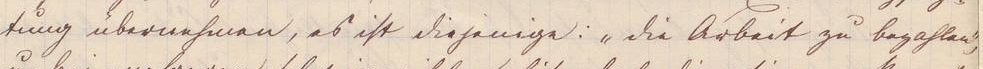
tung übernehmen, es ist diejenige: «die Arbeit zu bezahlen»
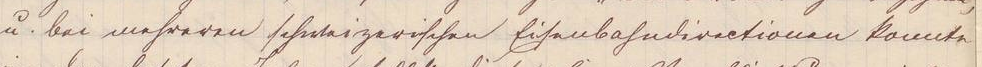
u. bei mehreren schweizerischen Eisenbahndirectionen konnte
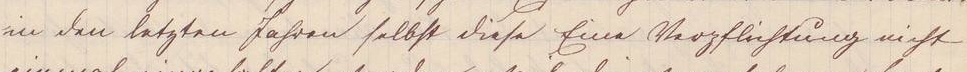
in den letzten Jahren selbst diese Eine Verpflichtung nicht
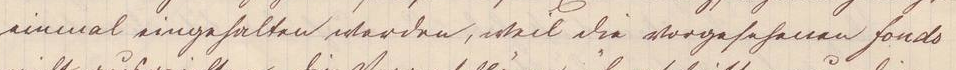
einmal eingehalten werden, weil die vorgesehenen Fonds
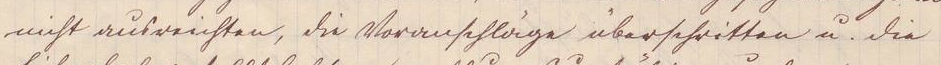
nicht ausreichten, die Voranschläge überschritten u. die
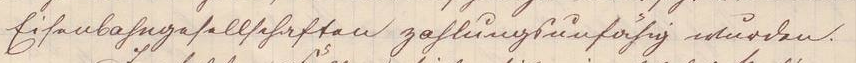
Eisenbahngesellschaften zahlungsunfähig wurden.
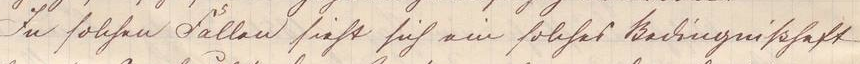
In solchen Fällen sieht sich ein solches Bedingnißheft
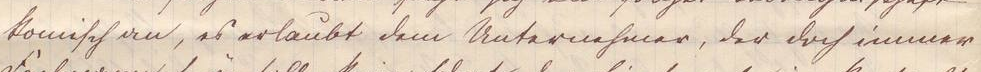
komisch an, es erlaubt dem Unternehmer, der doch immer
